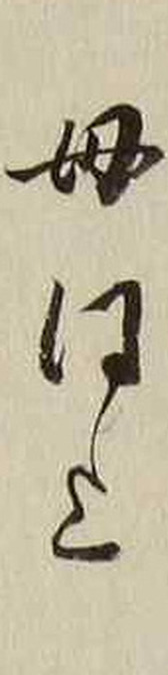母同上
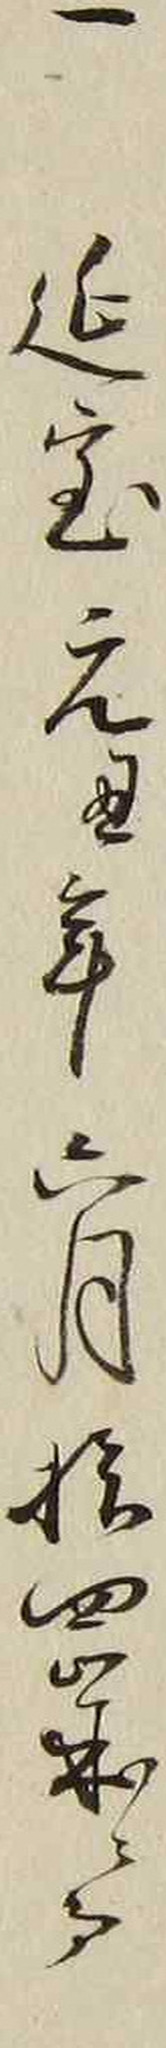一延宝元丑年六月十四歳にて
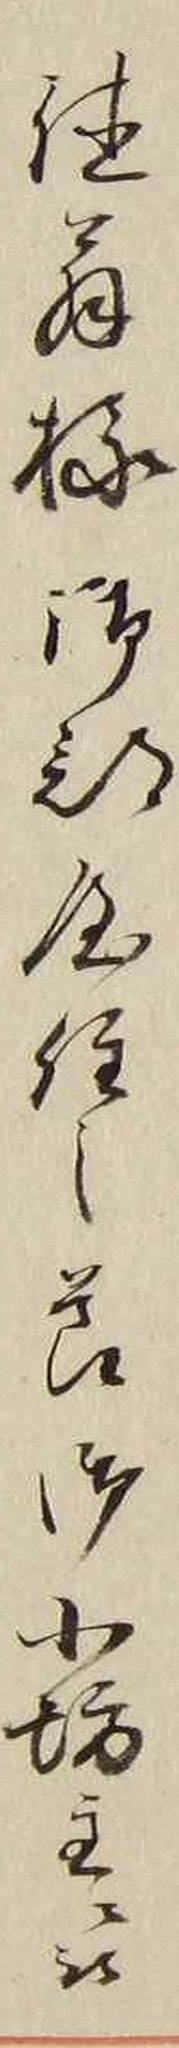徳翁様御部屋住之節御小坊主に被
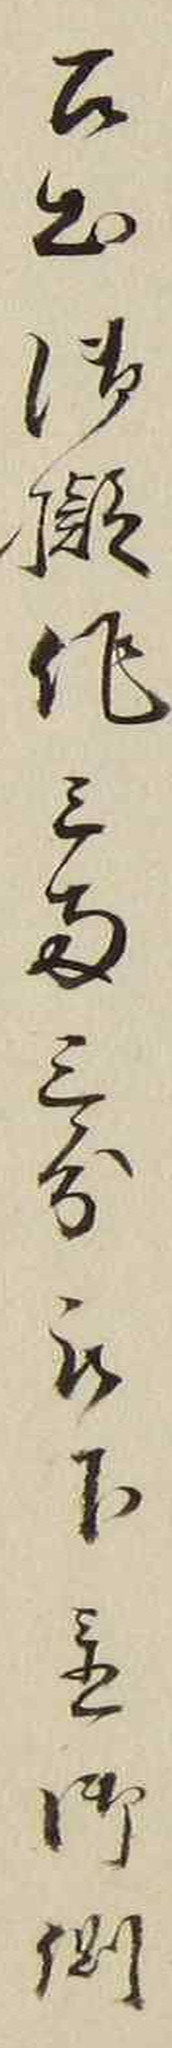召出御擬作三両三分被下置御側

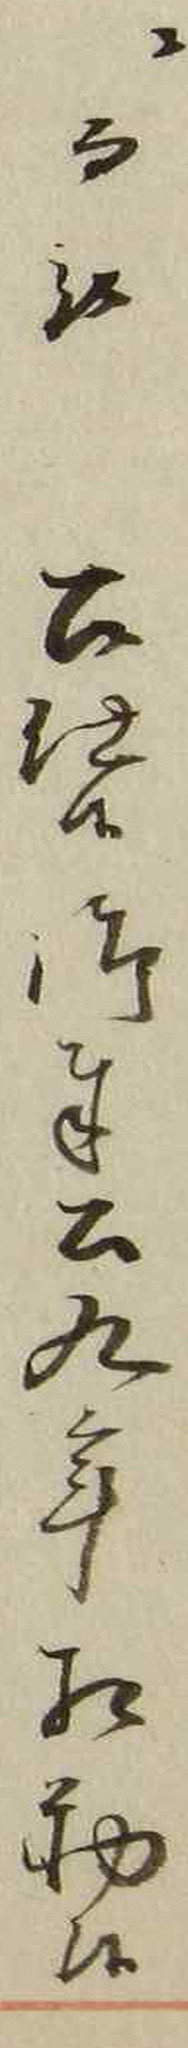にて被召仕候御奉公九年相勤候
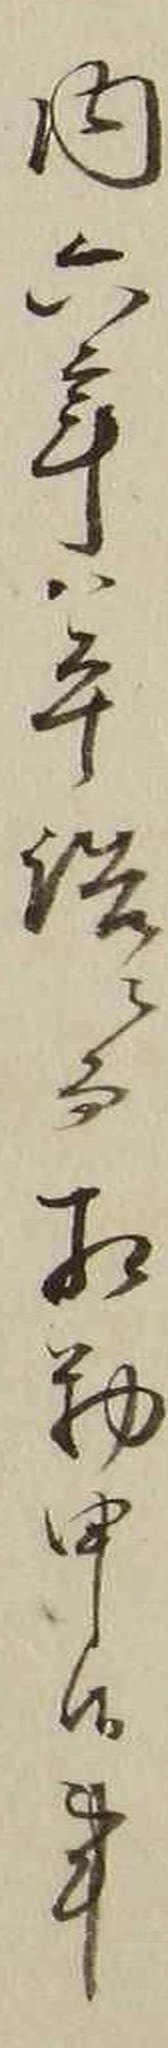内六年は平詰にて相勤申候事
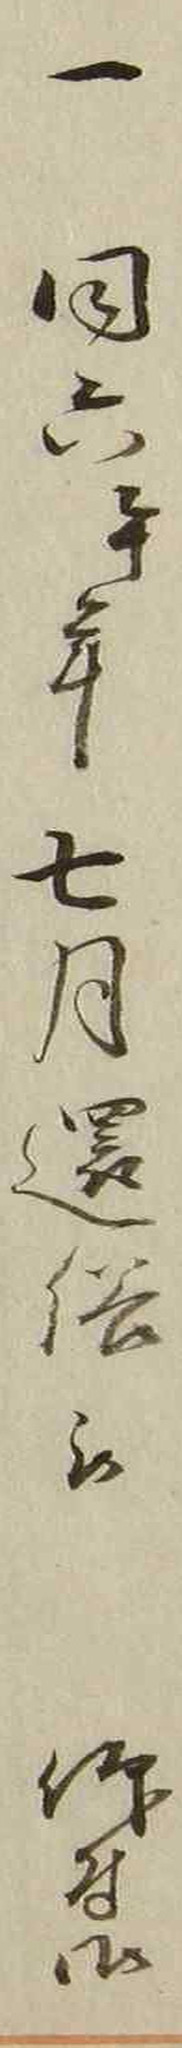一同六午年七月還俗被仰付御
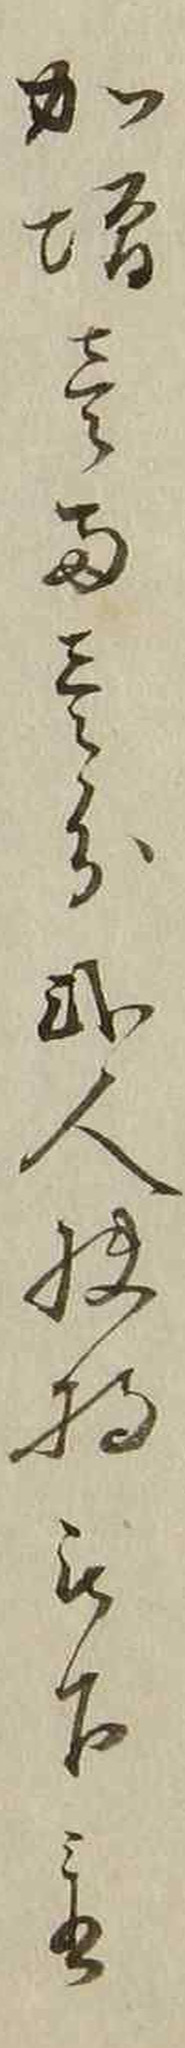加増一両一分二人扶持被下置
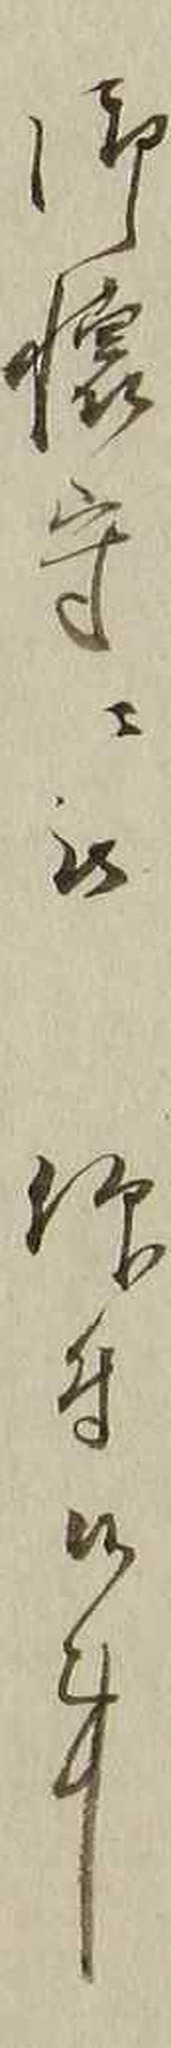御懐守に被仰付候事
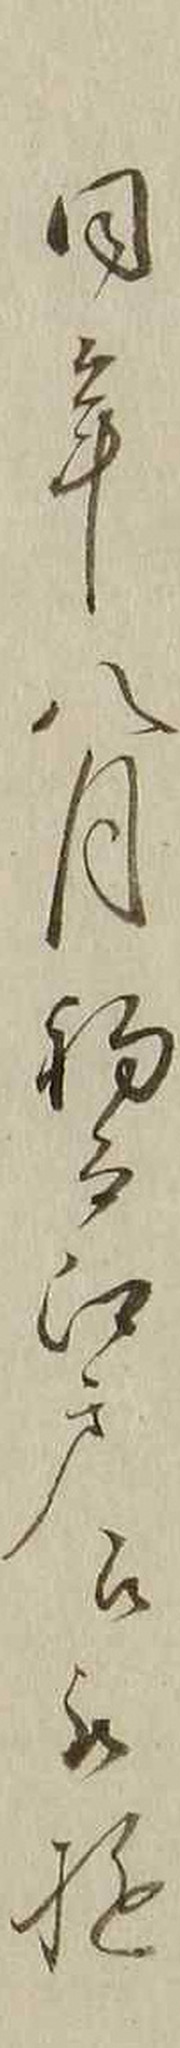一同年八月初て江戸へ被遊
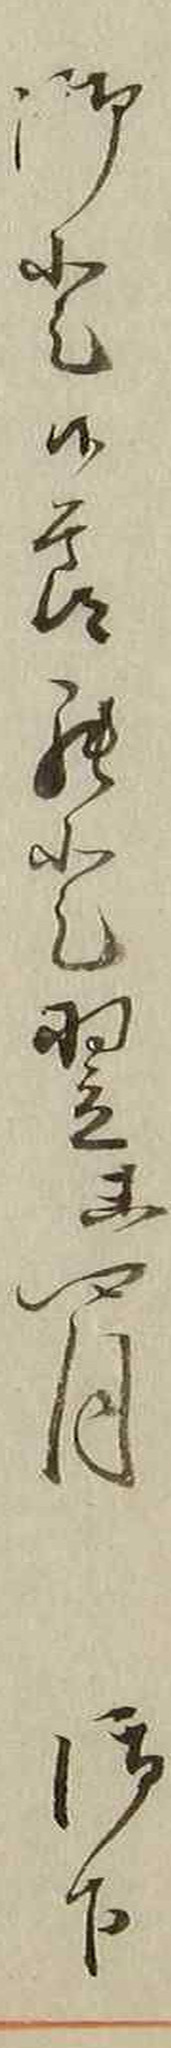御登候節罷登翌未四月御下
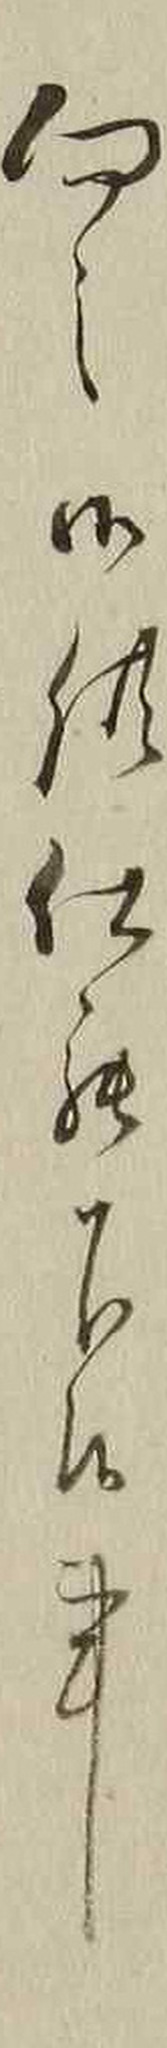向之御供仕罷下候事
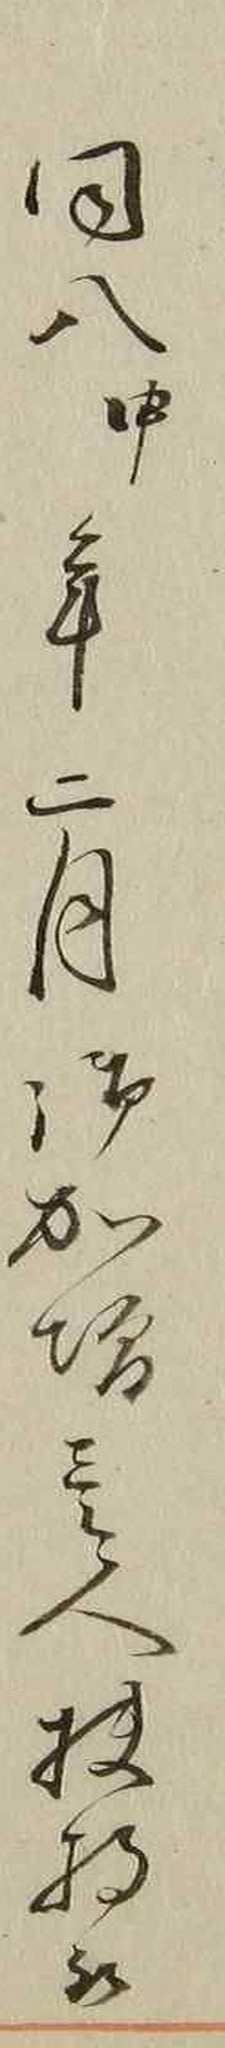一同八申年二月御加増一人扶持被
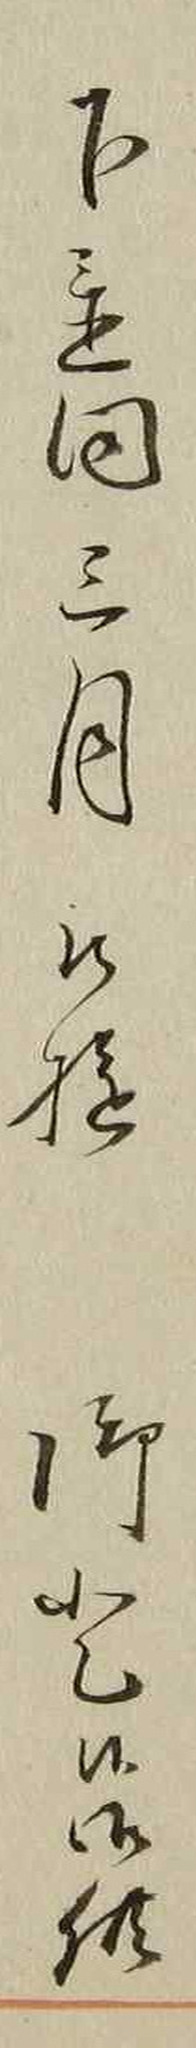下置同三月被遊御登候御供
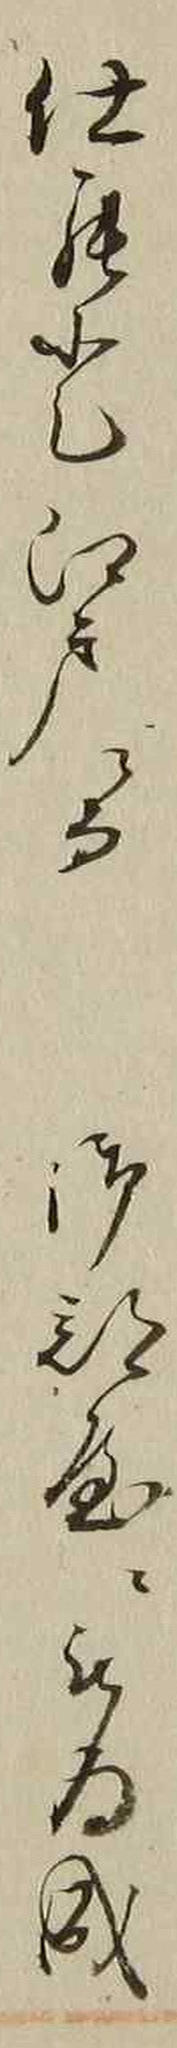仕罷登江戸にて御部屋に被為成
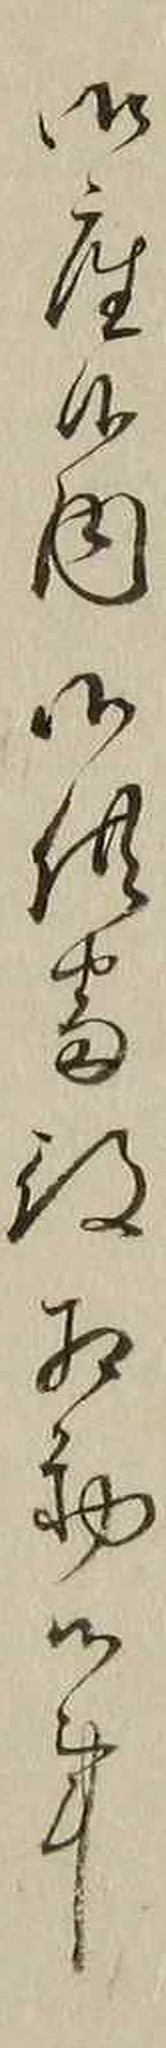御座候内御供番役相勤候事
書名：諸士系譜　巻之170　な之部12
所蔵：会津若松市立会津図書館
